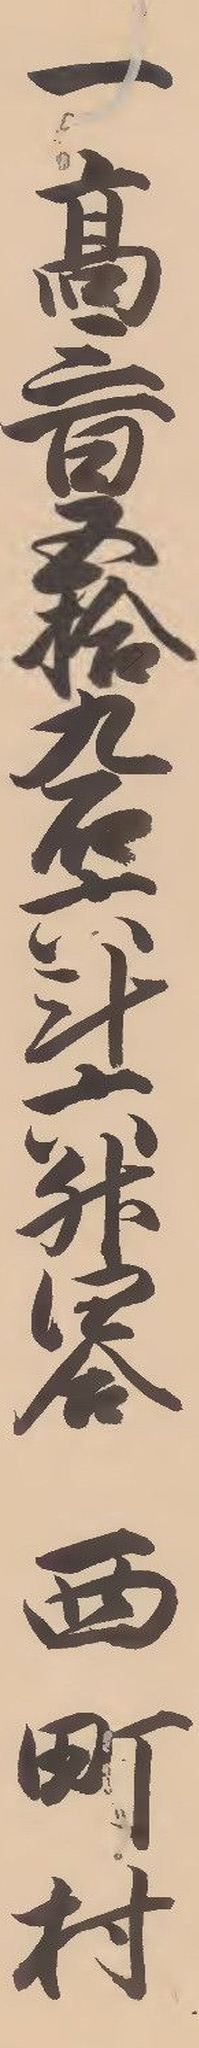一高三百五拾九石六斗六升四合西町村
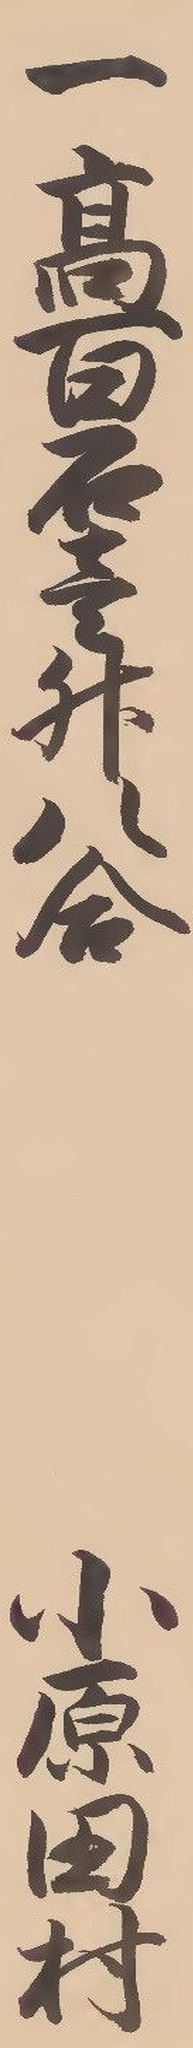一高百石壱升八合小原田村
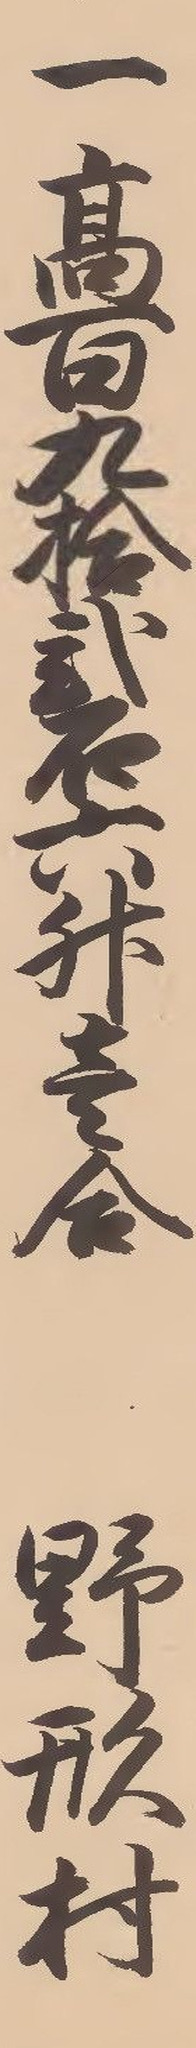一高百九拾弐石六升壱合野形村
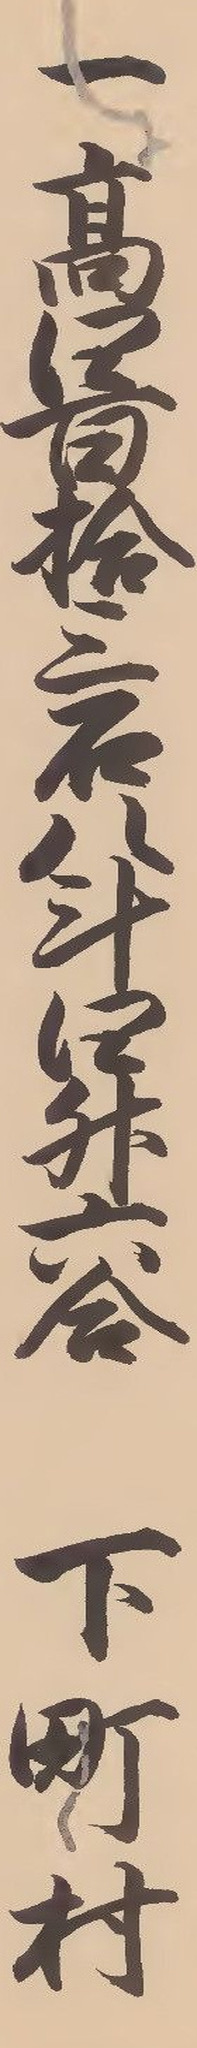一高四百拾三石八斗四升六合下町村
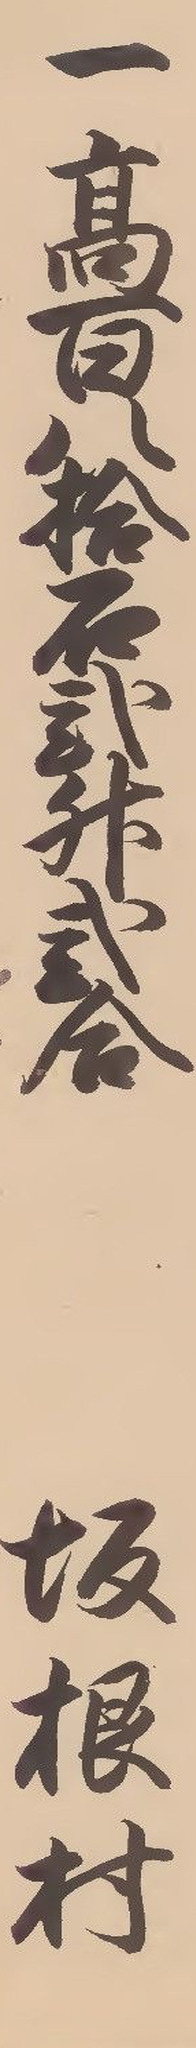一高百八拾石弐升弐合坂根村

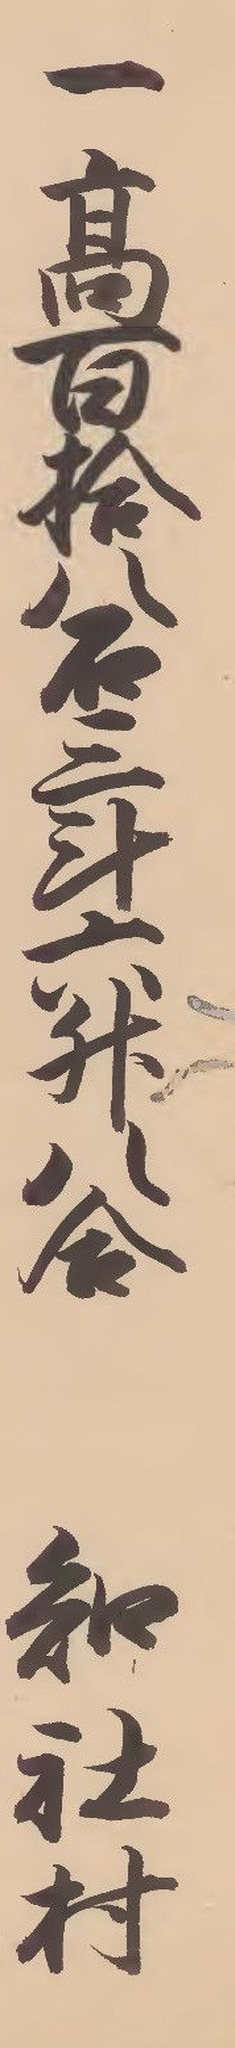一高百拾八石三斗六升八合知社村
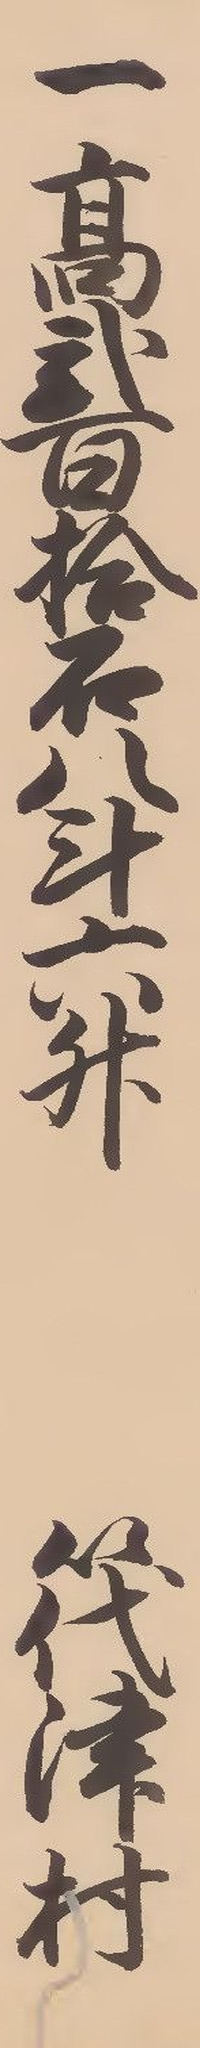一高弐百拾石八斗六升筏津村
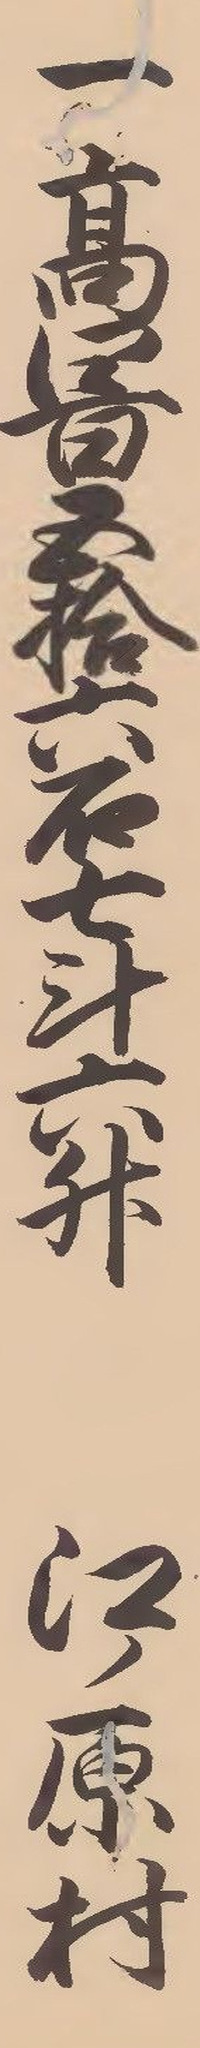一高四百五拾六石七斗六升江ノ原村
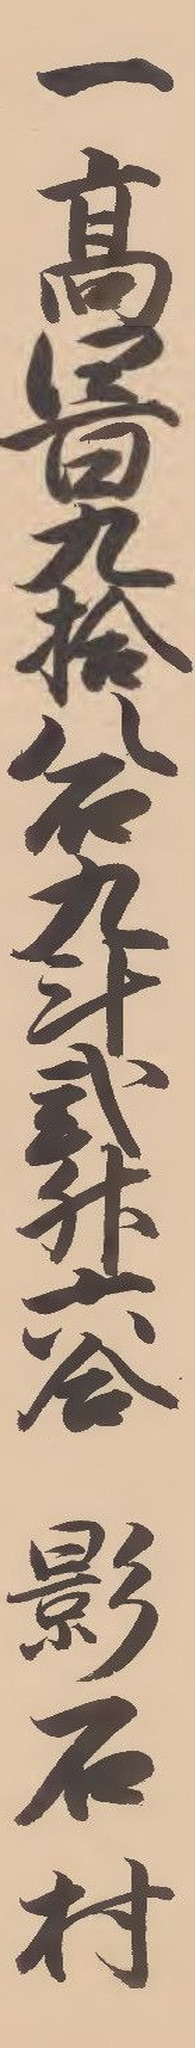一高四百九拾八石九斗弐升六合影石村
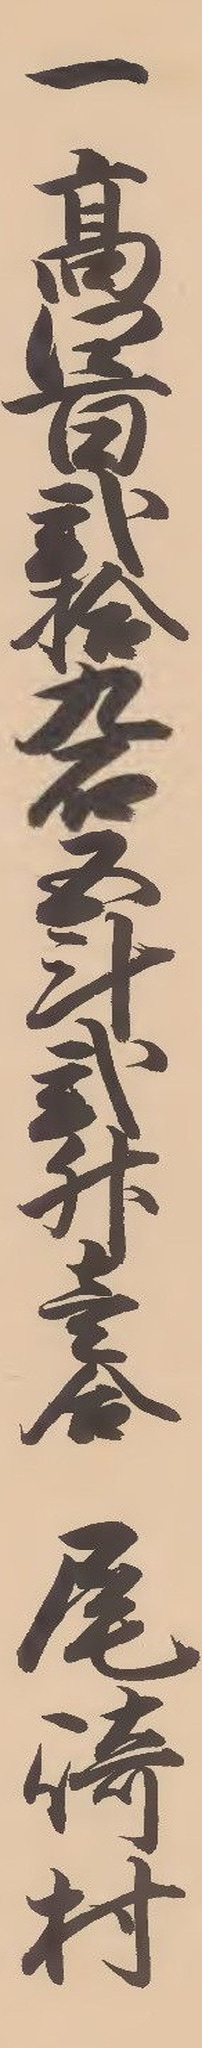一高四百弐拾九石五斗弐升壱合尾崎村
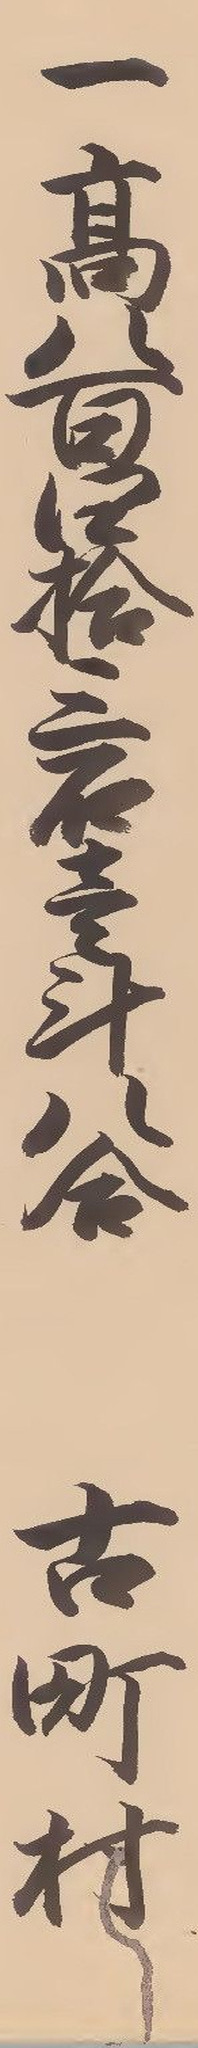一高八百四拾三石壱斗八合古町村
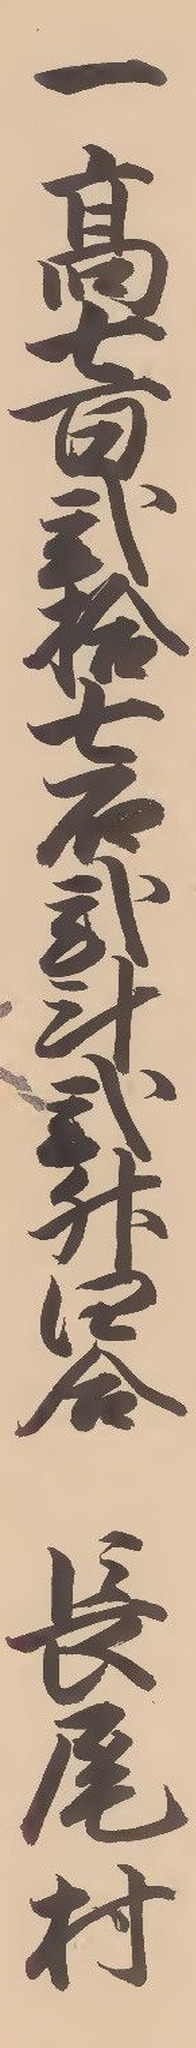一高七百弐拾七石弐斗弐升四合長尾村

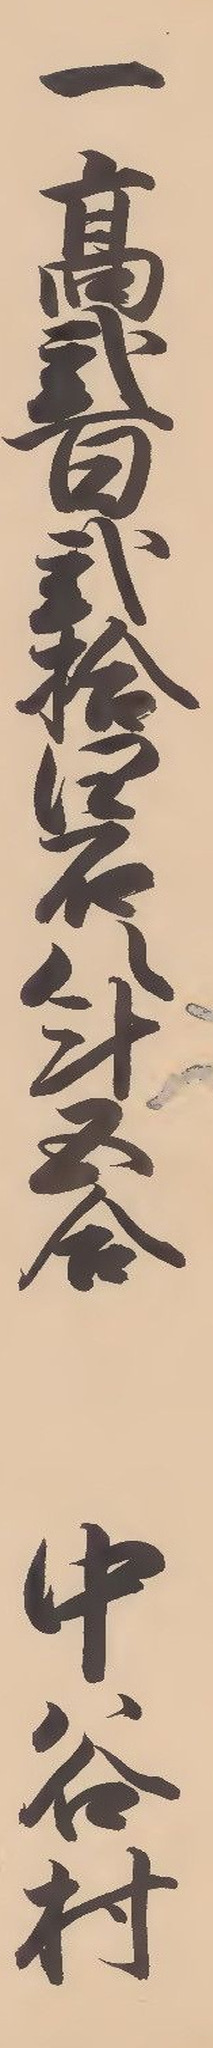一高弐百弐拾四石八斗五合中谷村
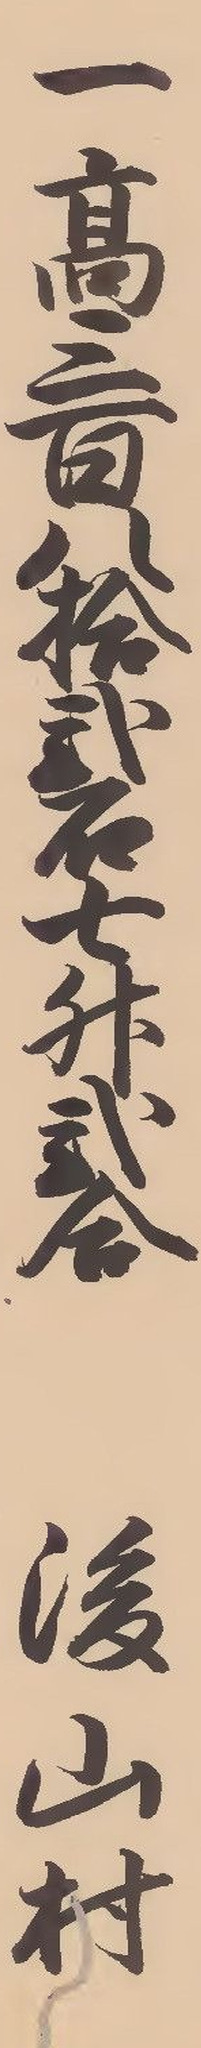一高三百八拾弐石七升弐合後山村
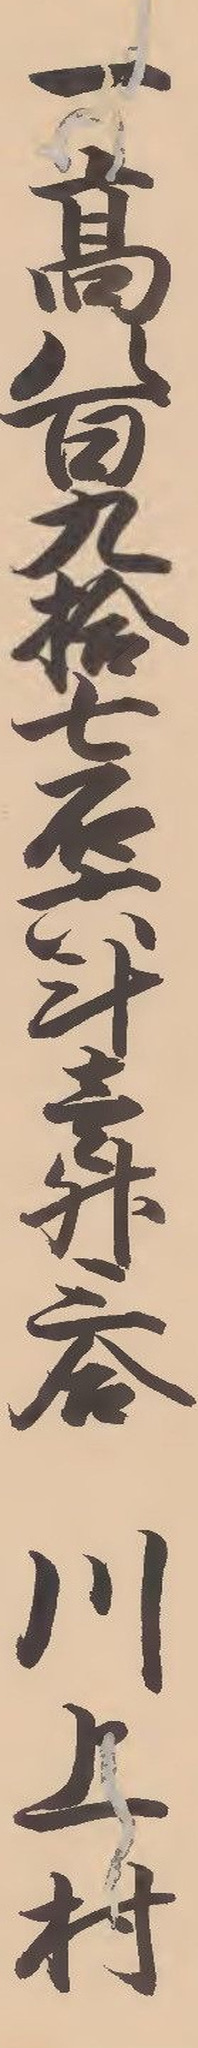一高八百九拾七石六斗壱升三合川上村
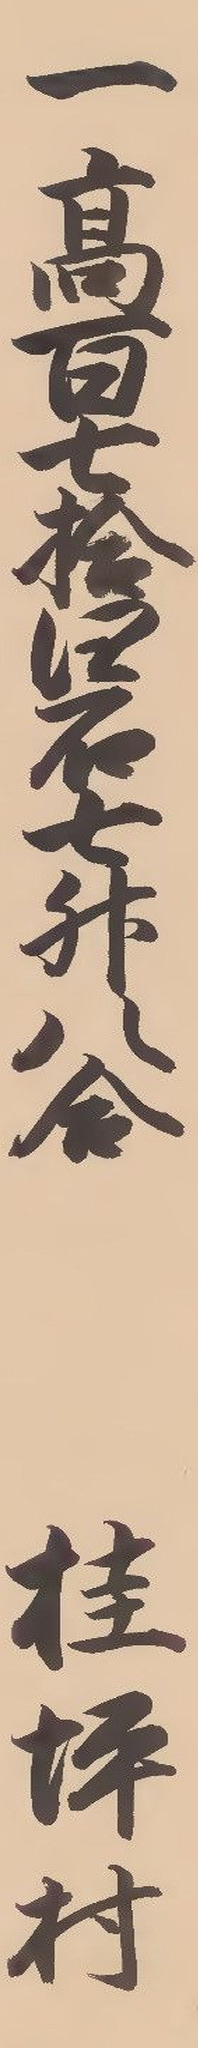一高百七拾四石七升八合桂坪村
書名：美作国郷帳
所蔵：国立公文書館 National Archives of Japan
